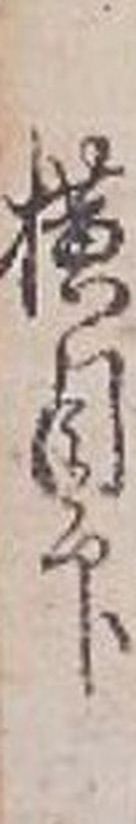横目印

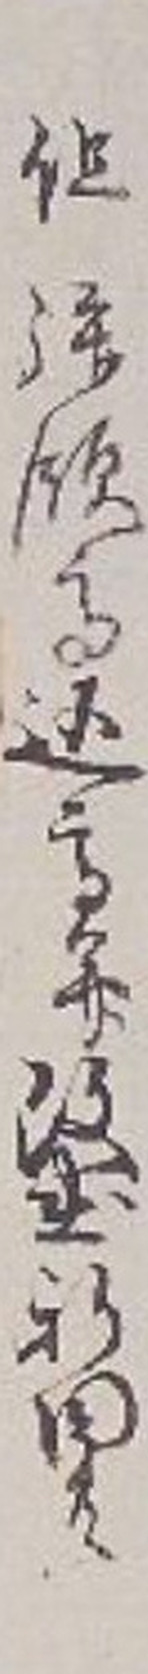但拝領高込高幷改出新田共何村
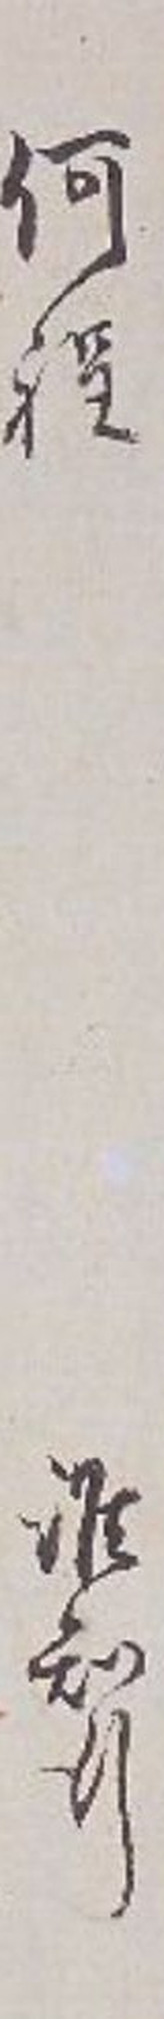何程誰知行
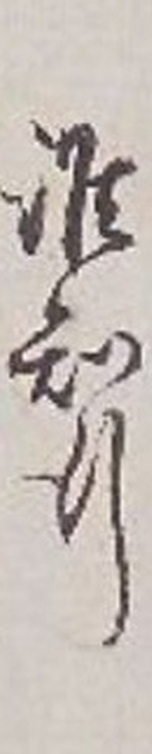誰知行
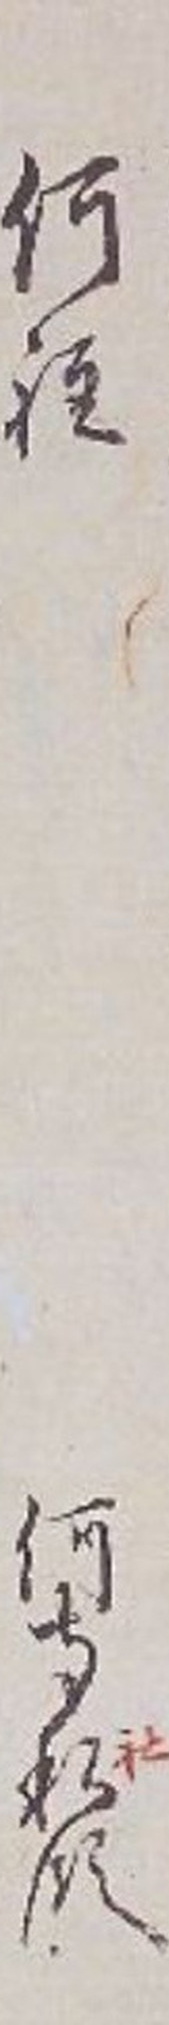何程何守私領
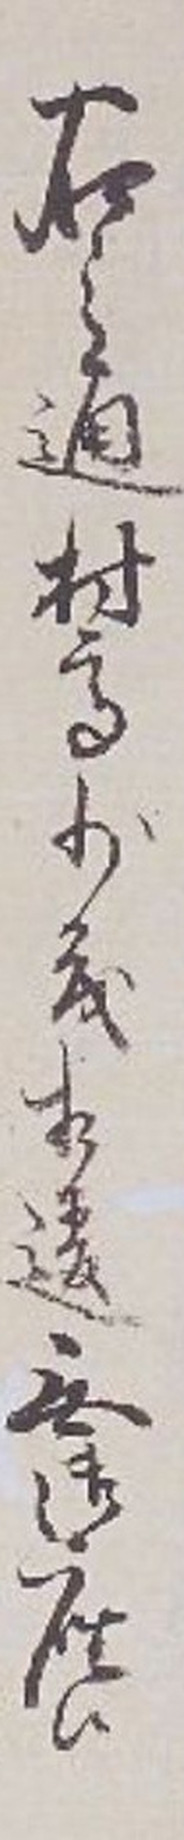右之通村高少も相違無御座候
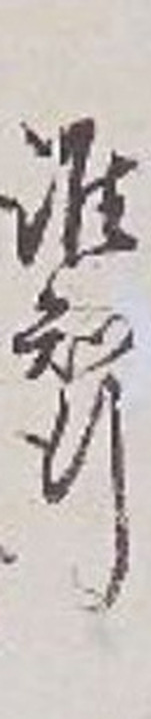誰知行
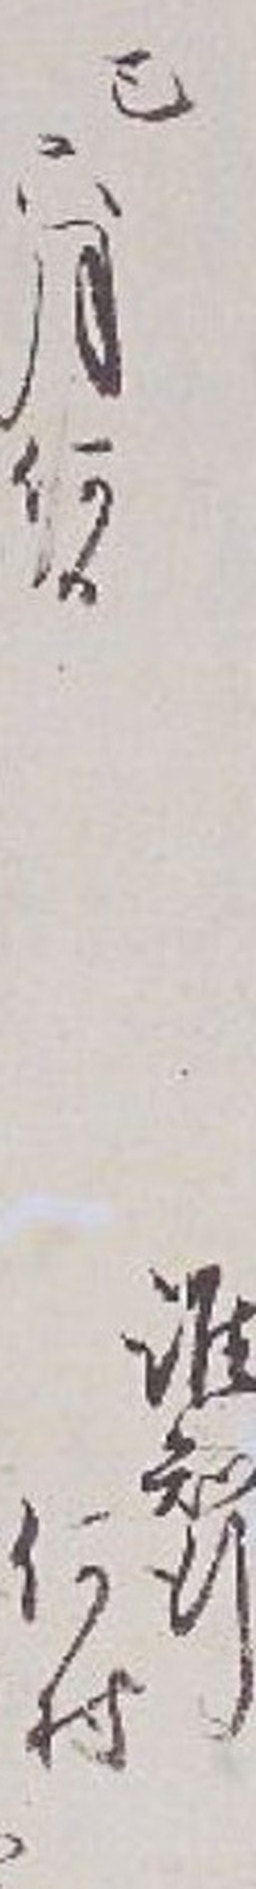巳六月何日何村
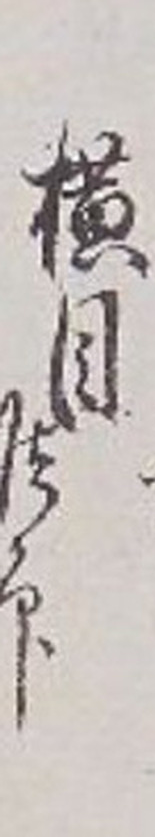横目誰印
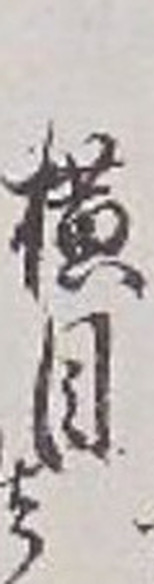横目印
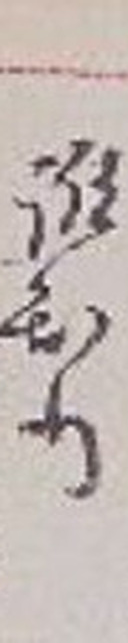誰知行
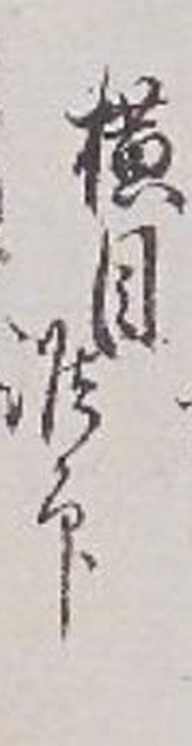横目印
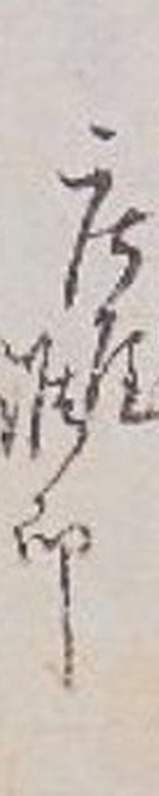庄屋誰印
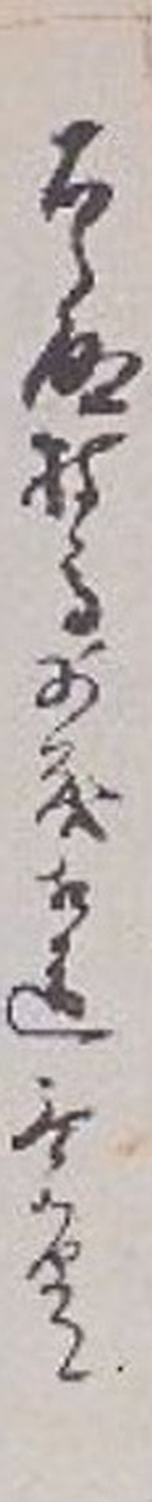右之通村高少も相違無御座候

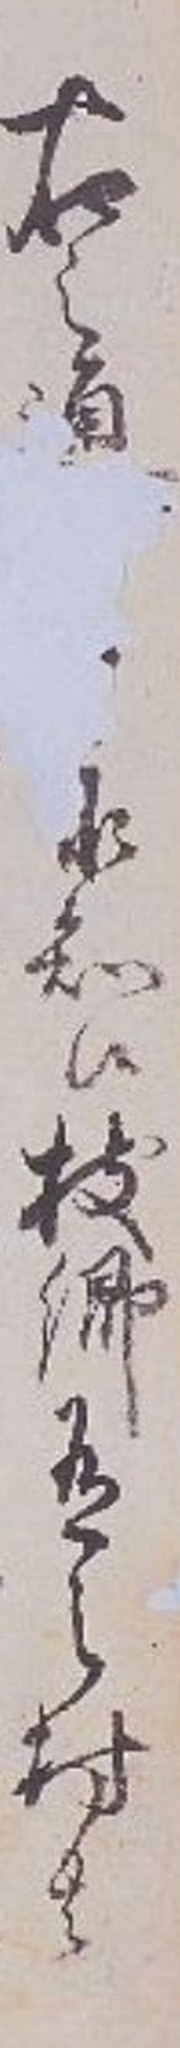右之通承知候枝郷有之村
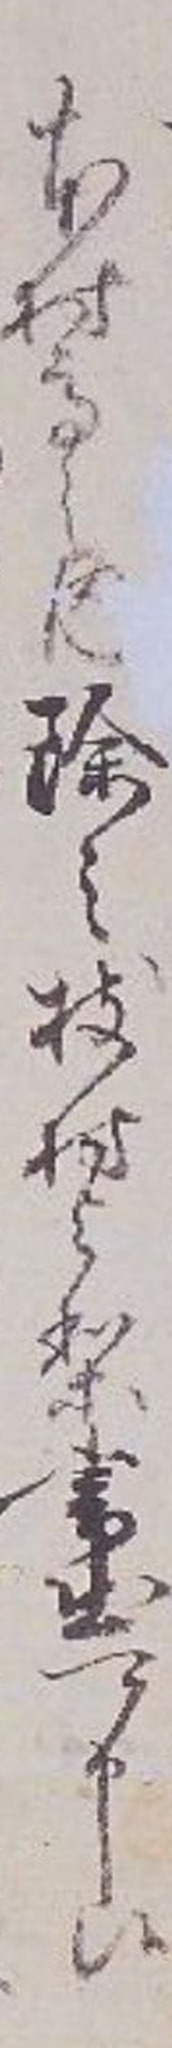本村高之除之枝村より書出可申候
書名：琉球人帰国に付国役金の記録
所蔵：University of the Ryukyus Library
